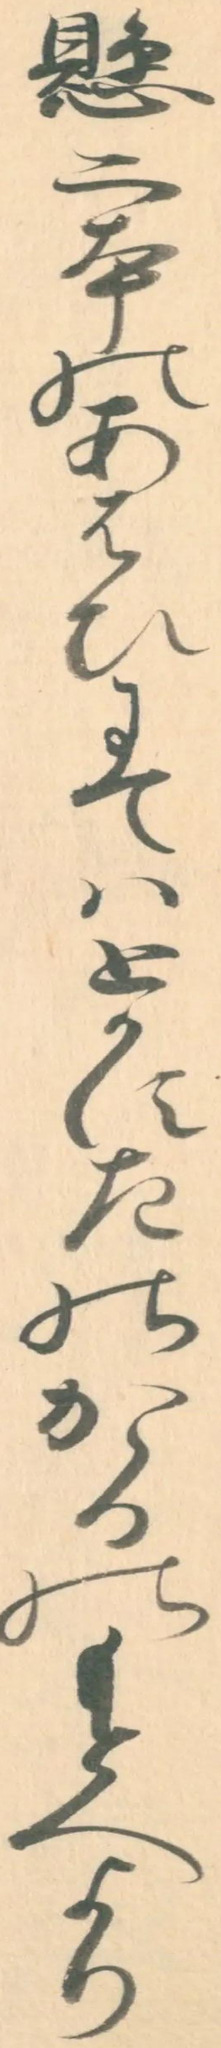懸二本のあはひにてはとかす左のかるのもとへより
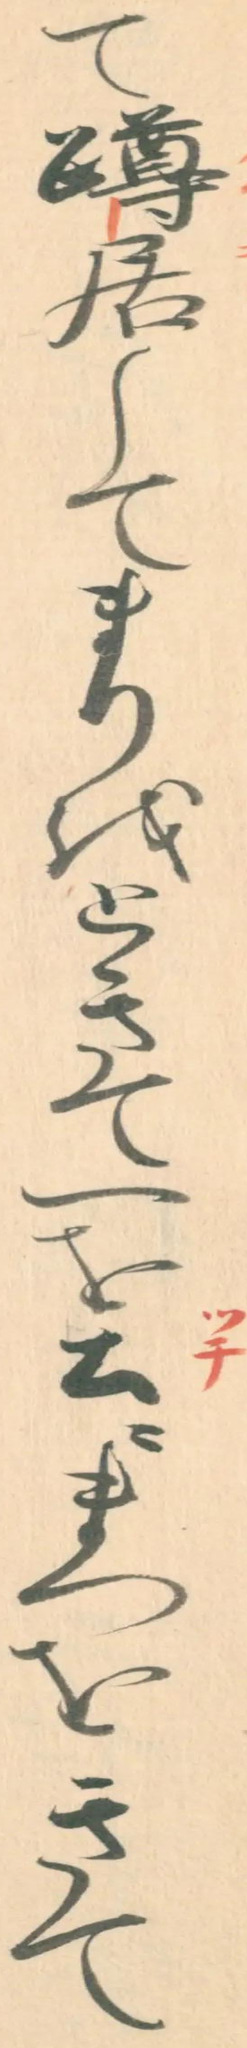て蹲居してまりをよきて一を土にまつをきて
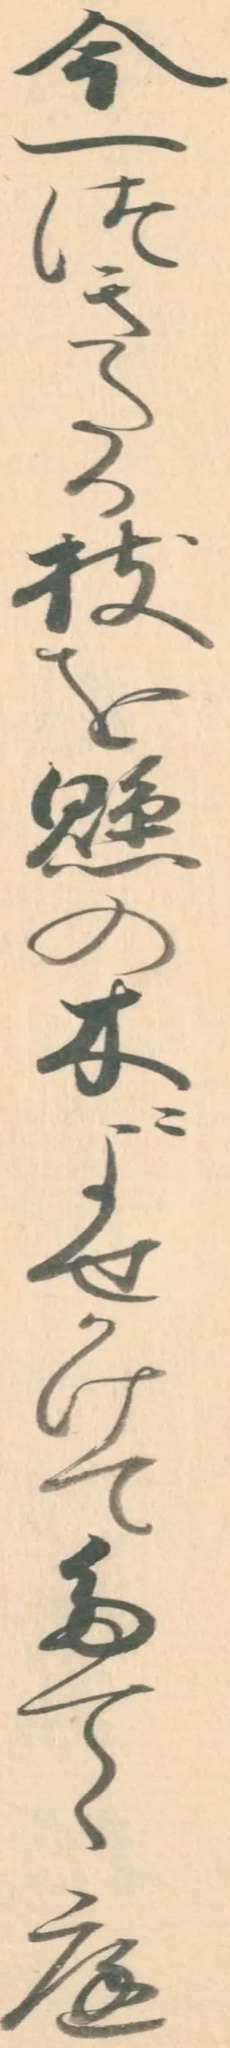今一つきたる枝を懸の気によせかけてたてゝ庭
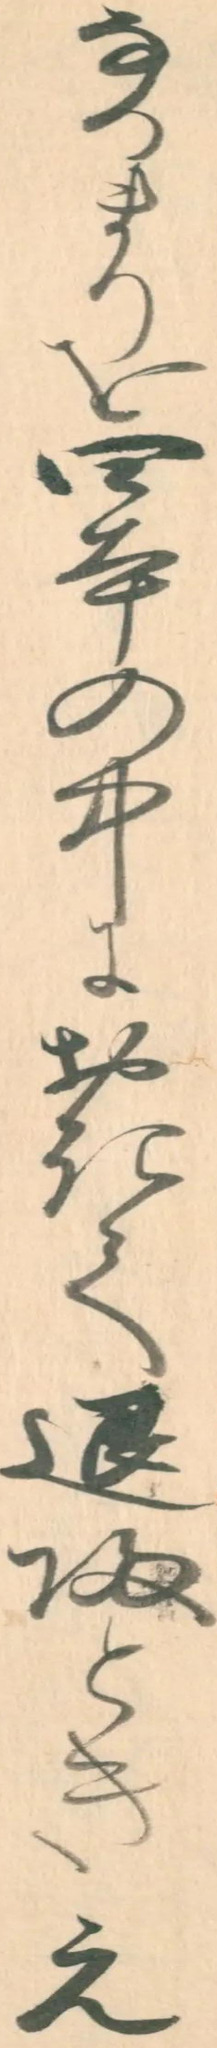なるまりを四本の中におきて退皈ときえ
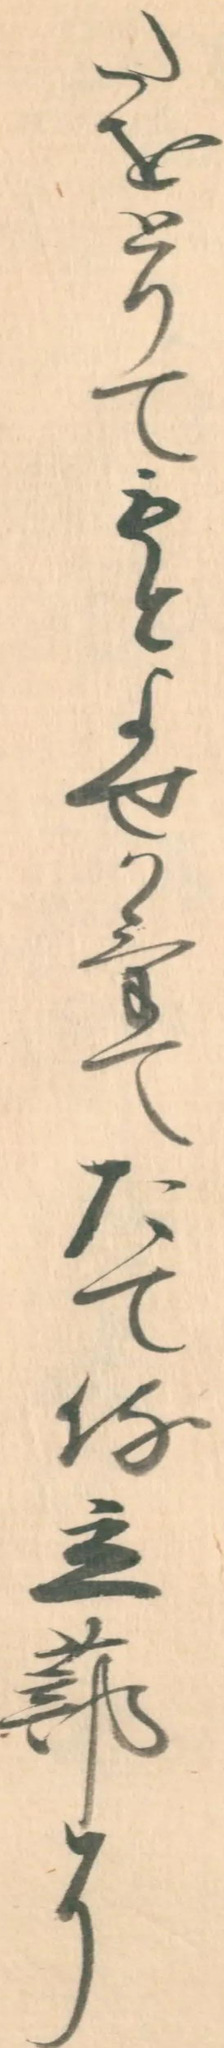たをとりてもとよせかけてたてに立蔀に
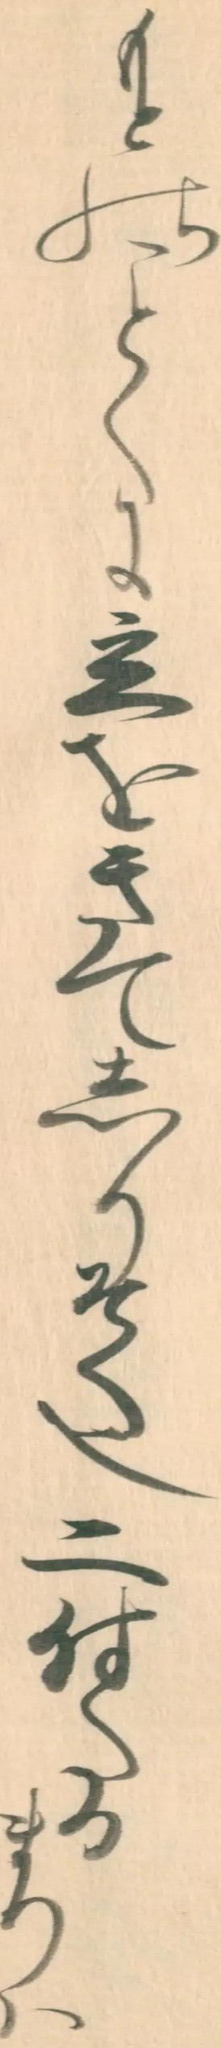もとのことくに立をきてしりそくなり二付たるまりは
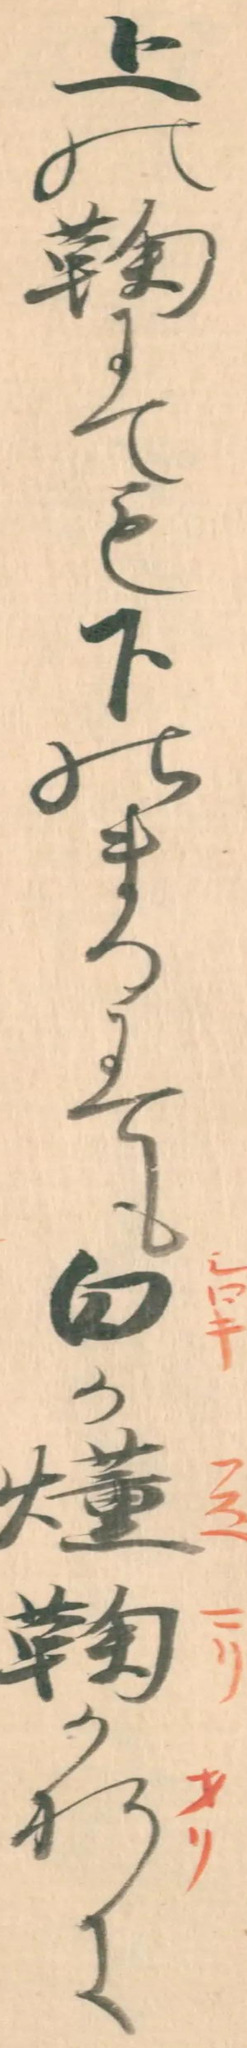上の鞠にても下のまりにても白か燻鞠か折に
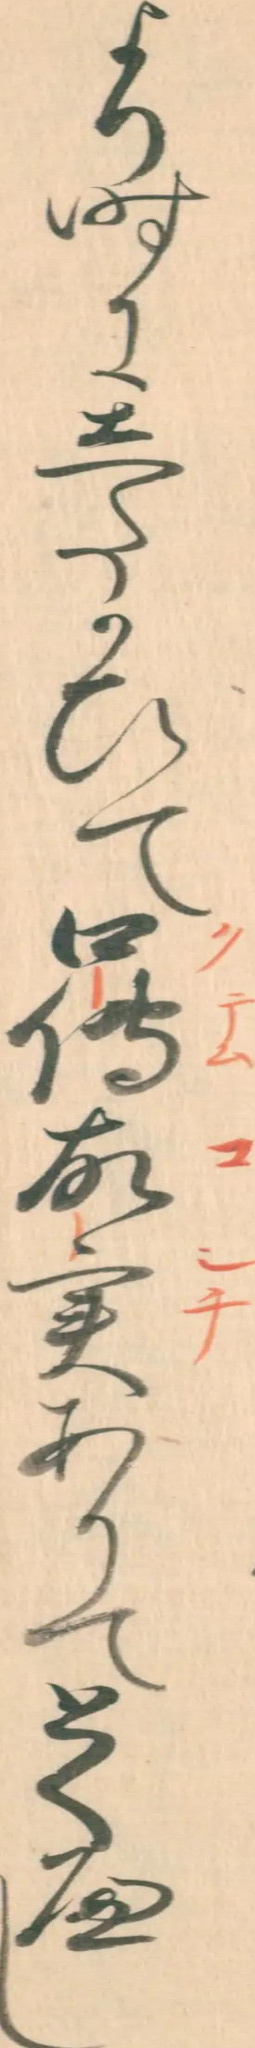より時にしたかひて口傳故実ありてとくへし
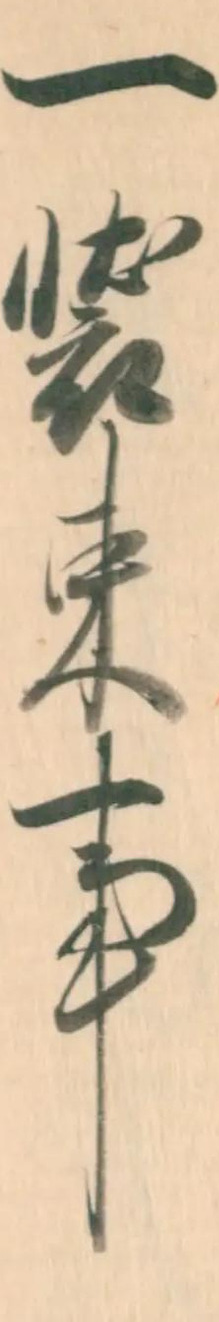一装束事
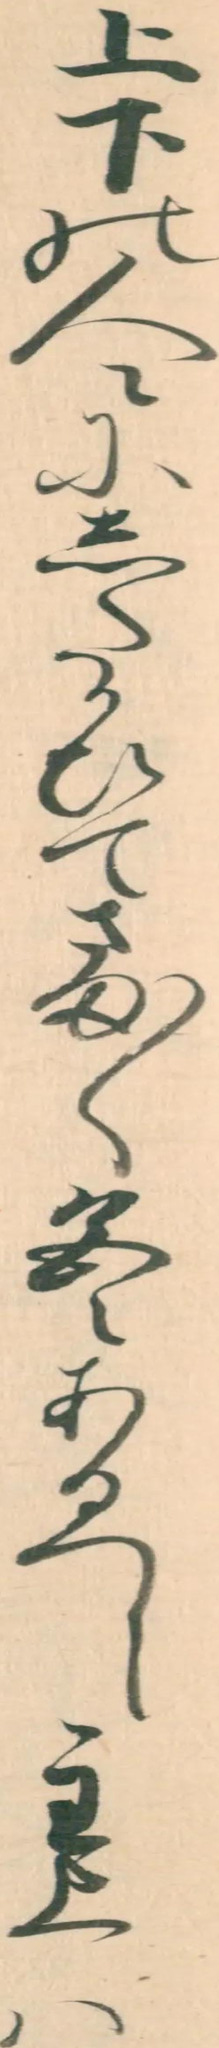上下の人々にしたかひてさま〳〵色々あるへし主上は
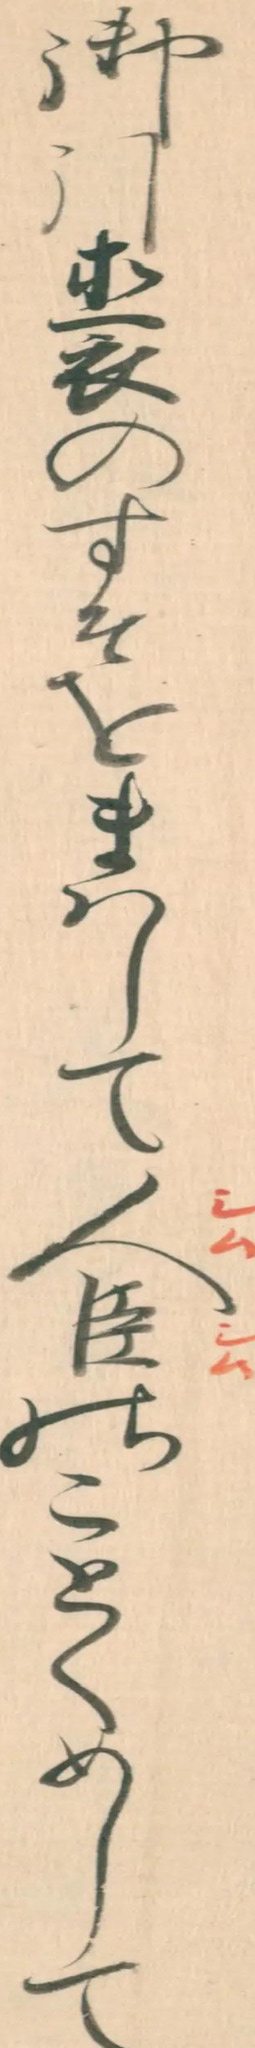御引のすそをまはして人臣のことくめして
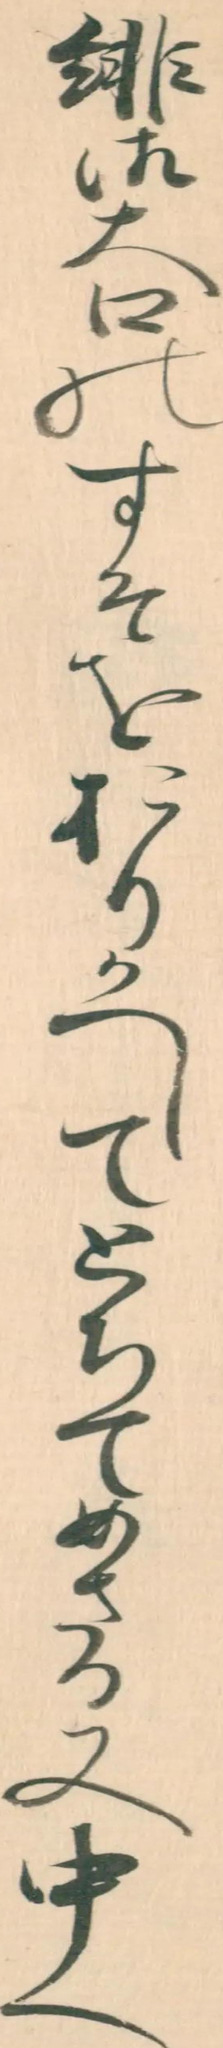緋御大口のすそをおりかへしてとちてめさる又中へ
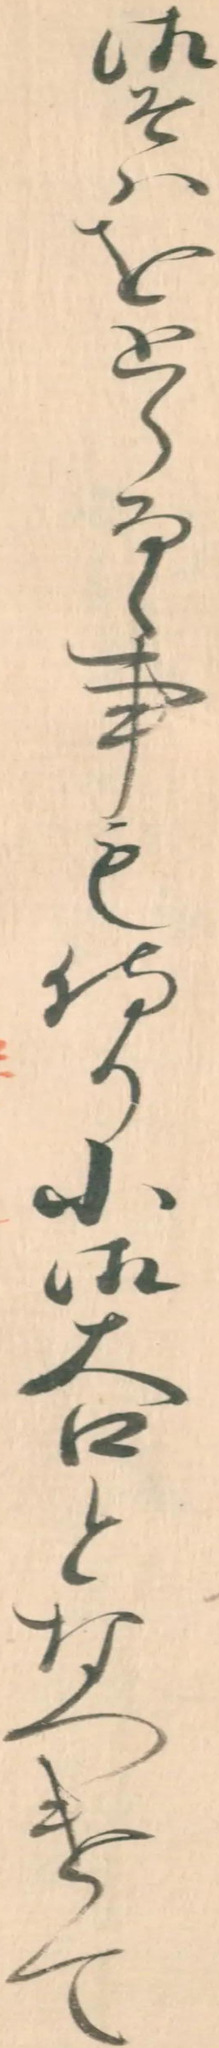御そはをとらるゝ事も侍り小御大口となつけて
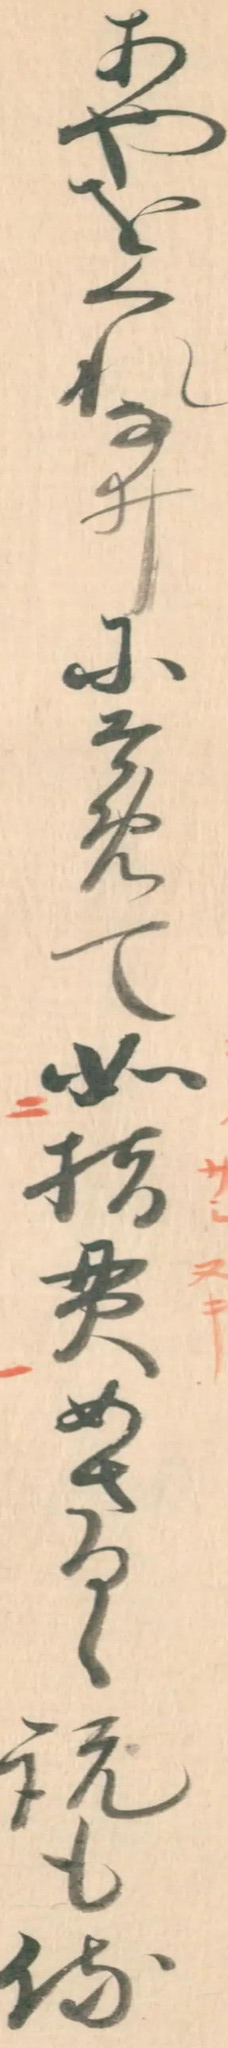あやをくれなゐにそめて如指貫めきたる説も侍
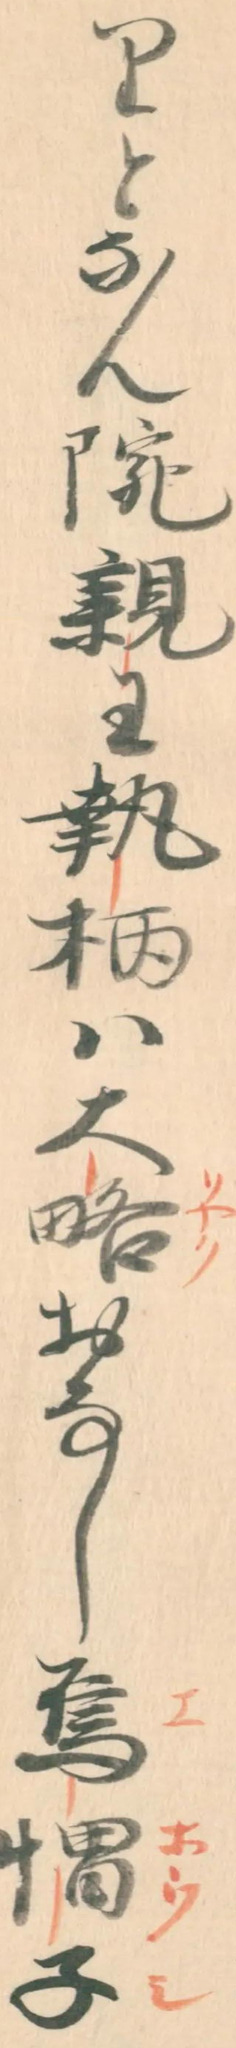りとなん院親王執柄は大略おなし烏帽子
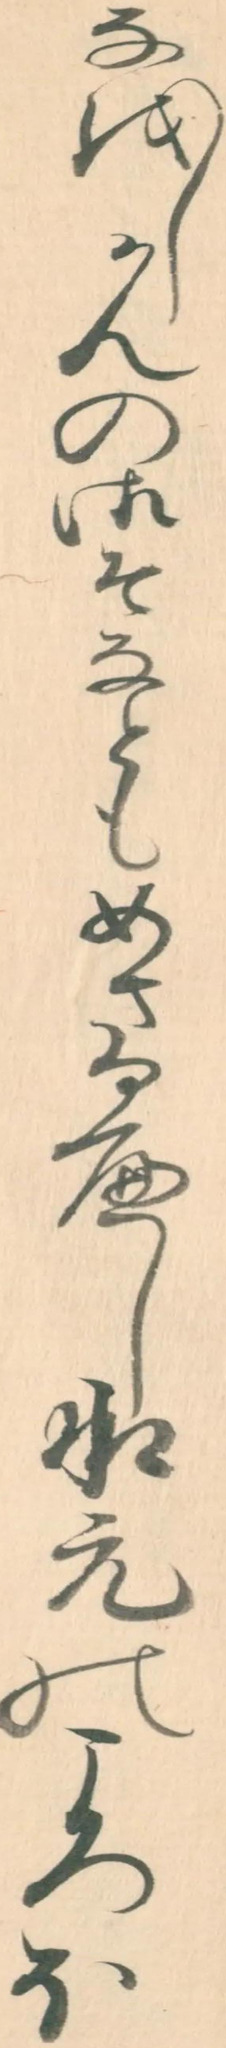なをしかんの御そなともめさるへし承久のよそほ
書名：遊庭秘抄 2巻. [1]
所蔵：国立国会図書館 National Diet Library, JAPAN
